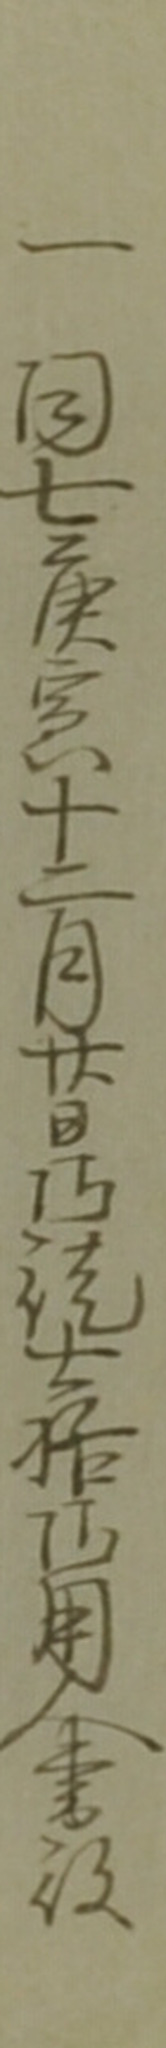一同七庚寅十二月廿日御徒士格御用人書役
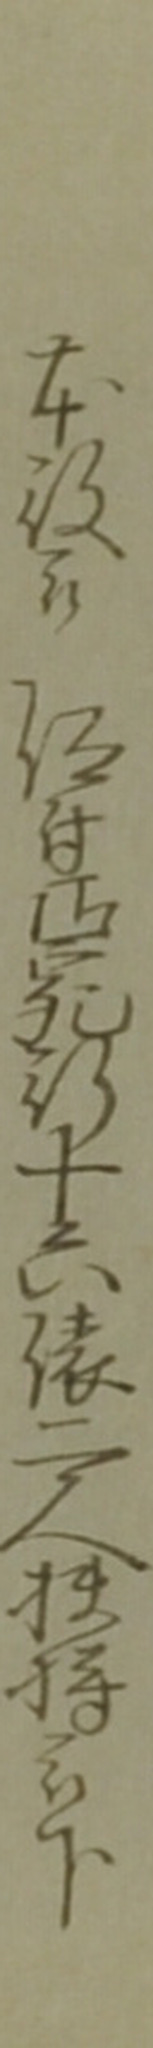本役被仰付御宛行十六俵二人扶持被下
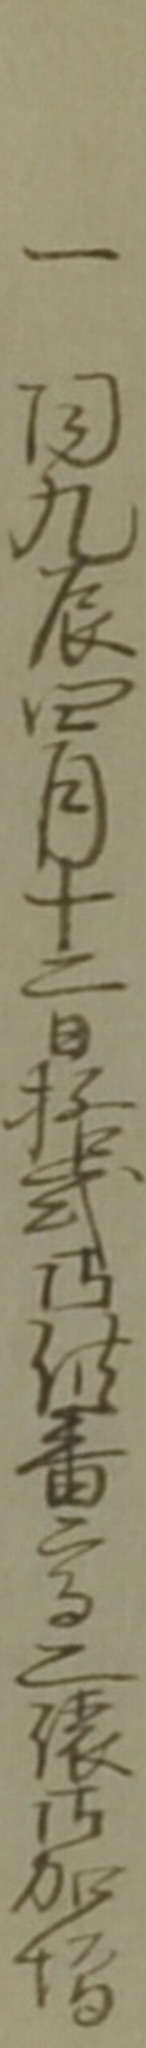一同九辰四月十二日格式御供番高二俵御加増
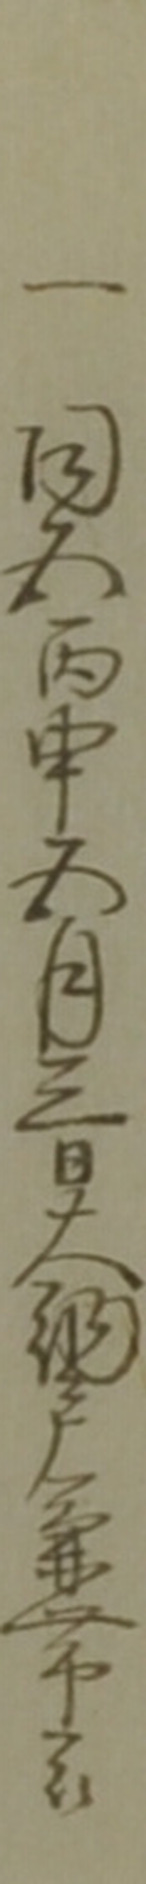一同五丙申五月三日大納戸兼帯被
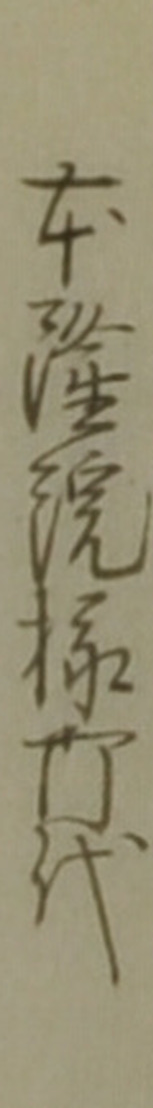本隆院様御代
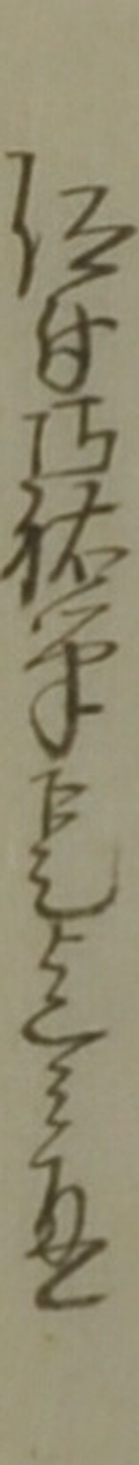仰付御祐筆是迄之通
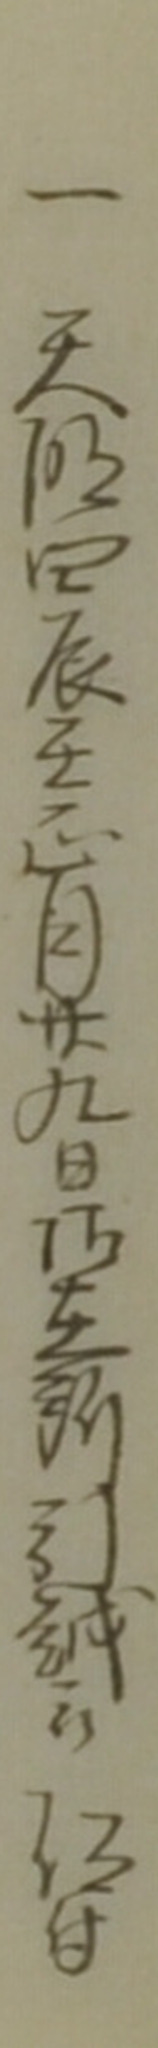一天明四辰閏正月廿九日御在所引越被仰付
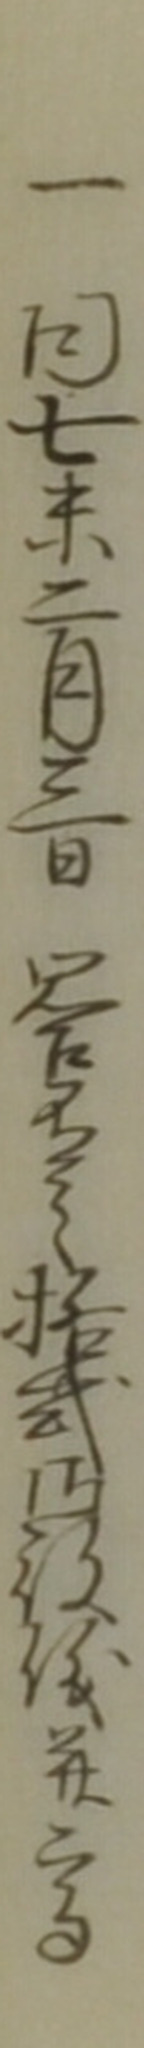一同七未二月三日思召有之格式御役儀并高
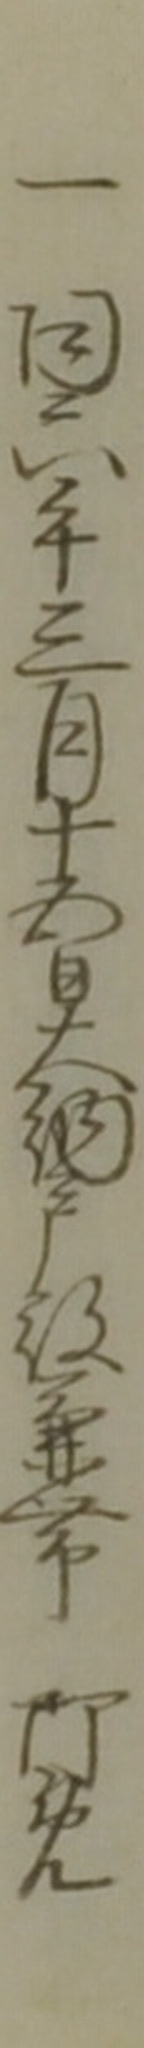一同六午三月十五日大納戸役兼帯御免
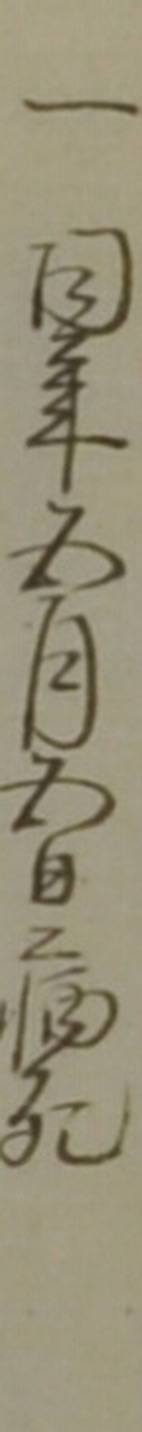一同年五月五日病死
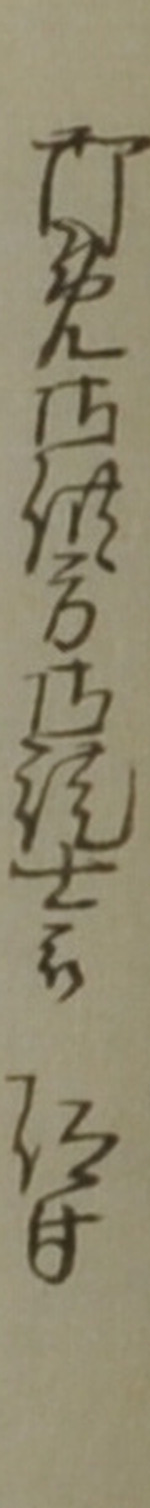御免御供方御徒士被仰付
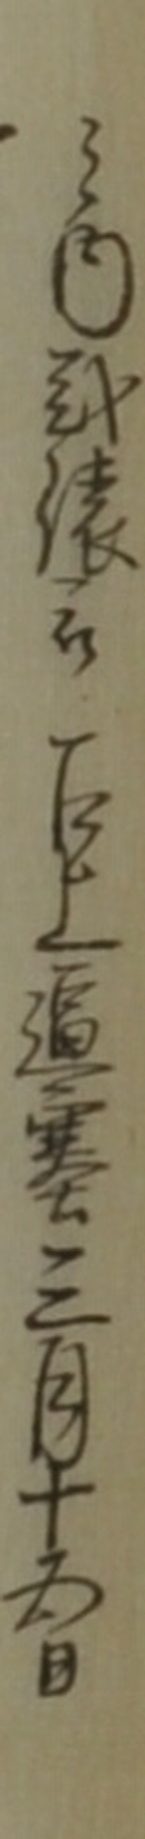之内弐俵被召上逼塞三月十五日
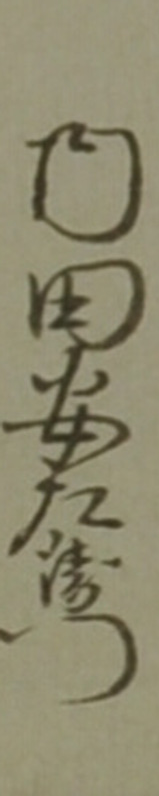内田安左衛門
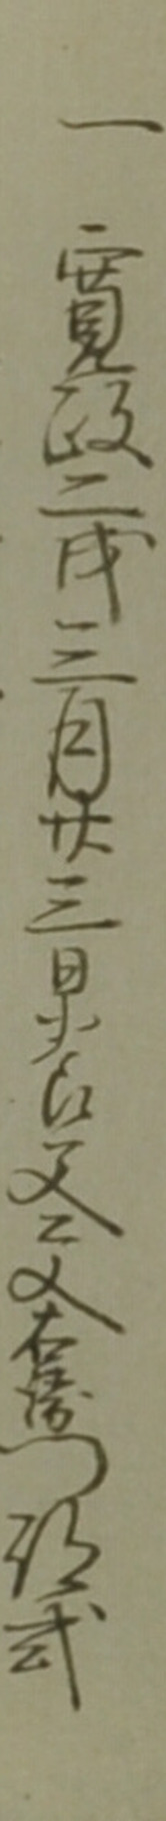一寛政二戌三月廿三日養父文右衛門跡式

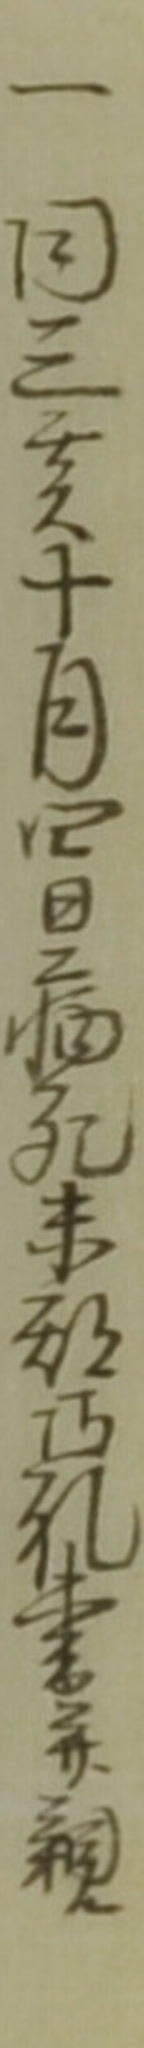一同三亥十月四日病死末期御礼書并親
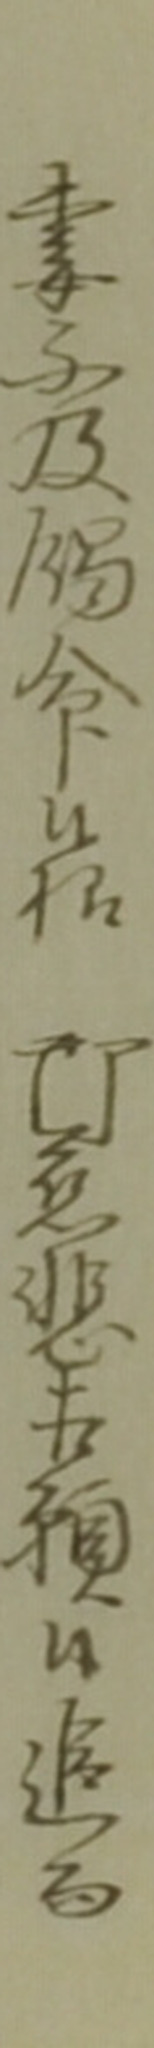妻不及命候様御慈悲相願候追而
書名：無足諸士勤仕録（七）
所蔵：伊那市立高遠町図書館・合同会社AMANE
